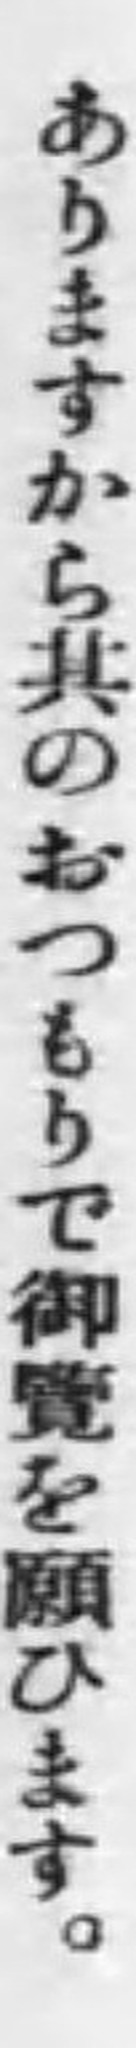ありますから其のおつもりで御覧を願ひます。
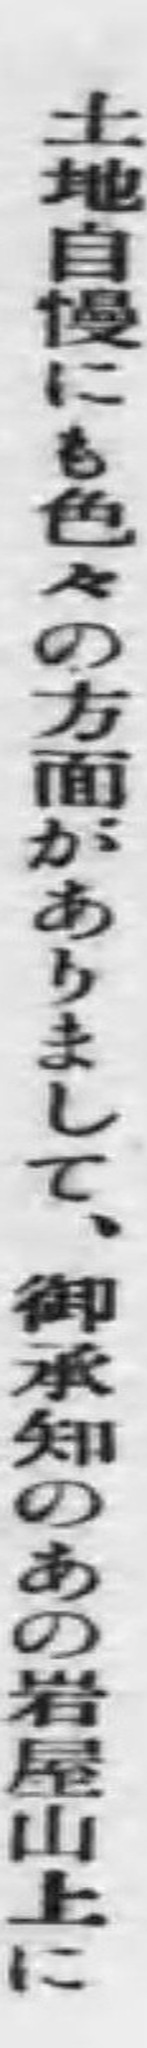土地自慢にも色々の方面がありまして、御承知のあの岩屋山上に
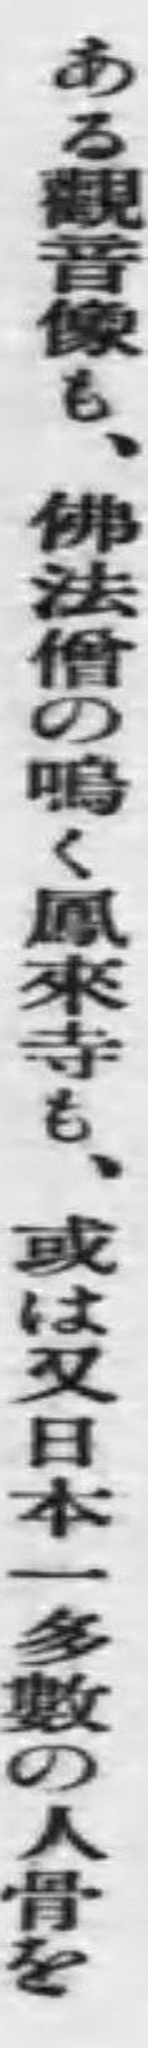ある観音像も、仏法僧の鳴く鳳来寺も、或は又日本一多数の人骨を
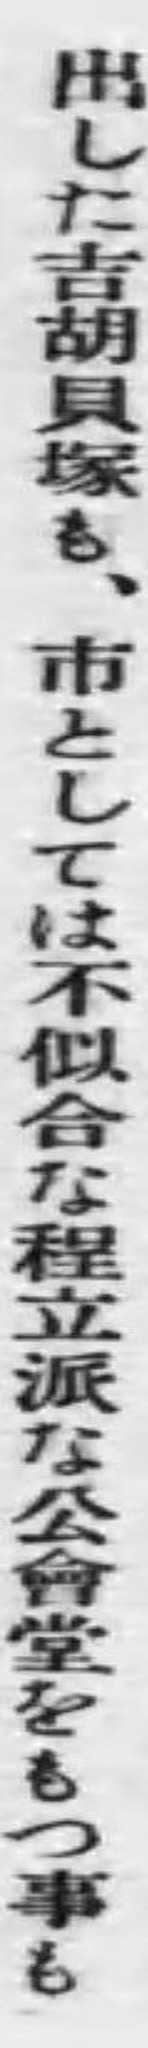出した吉胡貝塚も、市としては不似合な程立派な公会堂をもつ事も
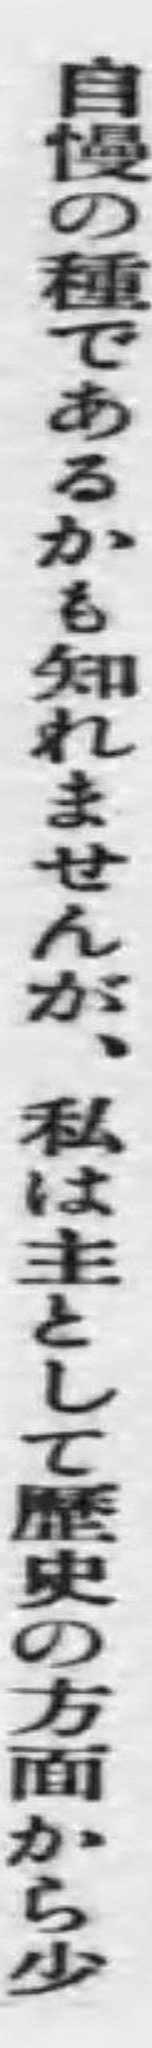自慢の種であるかも知れませんが、私は主として歴史の方面から少
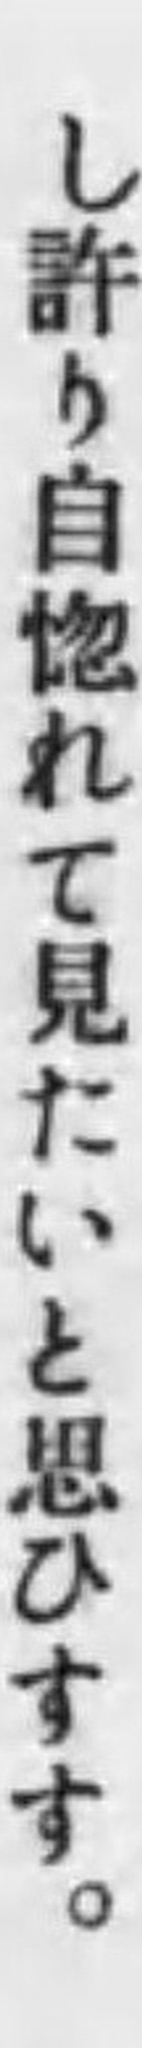し許り自惚れて見たいと思ひすす。
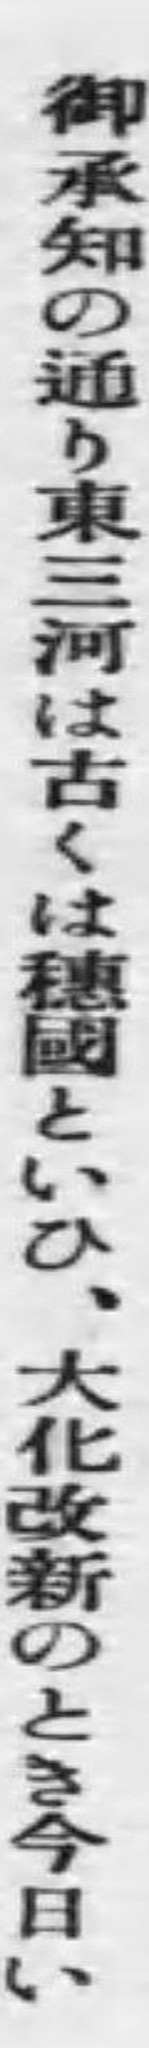御承知の通り東三河は古くは穂国といひ、大化改新のとき今日い
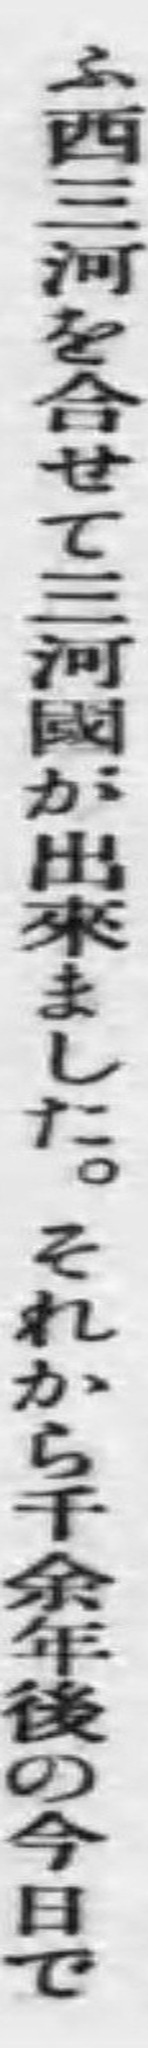ふ西三河を合せて三河国が出来ました。それから千余年後の今日で
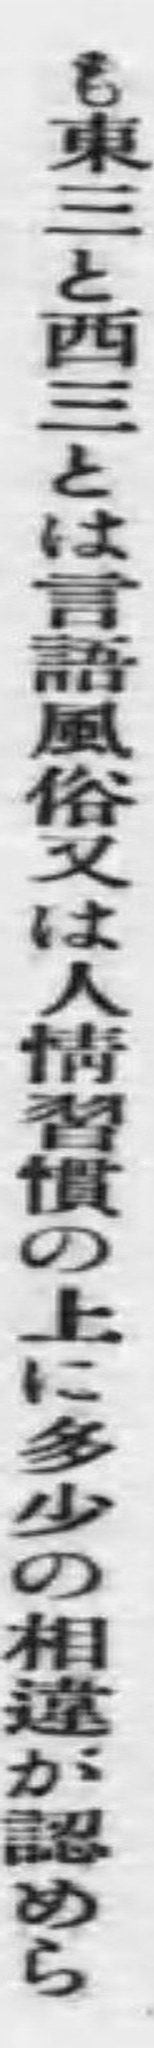も東三と西三とは言語風俗又は人情習慣の上に多少の相違が認めら
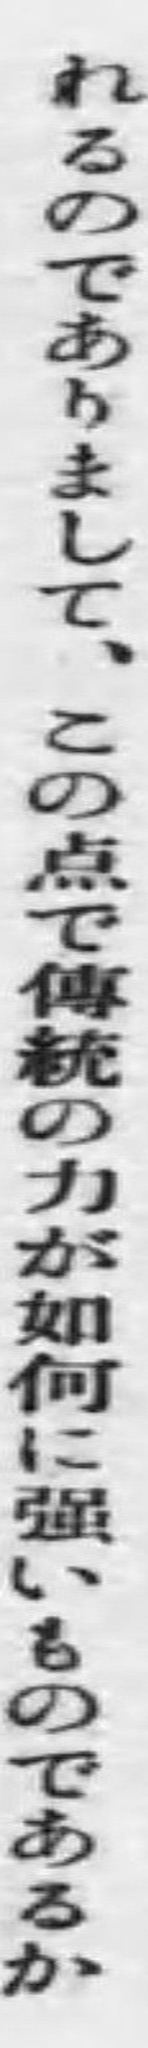れるのでありまして、この点で伝統の力が如何に強いものであるか
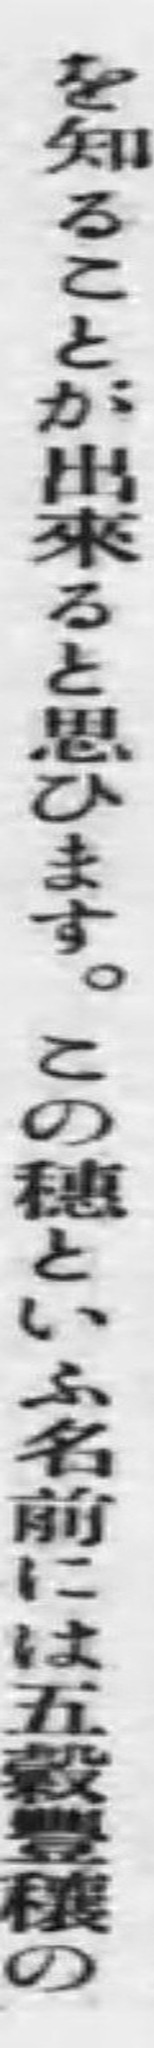を知ることが出来ると思ひます。この穂といふ名前には五穀豊穣の
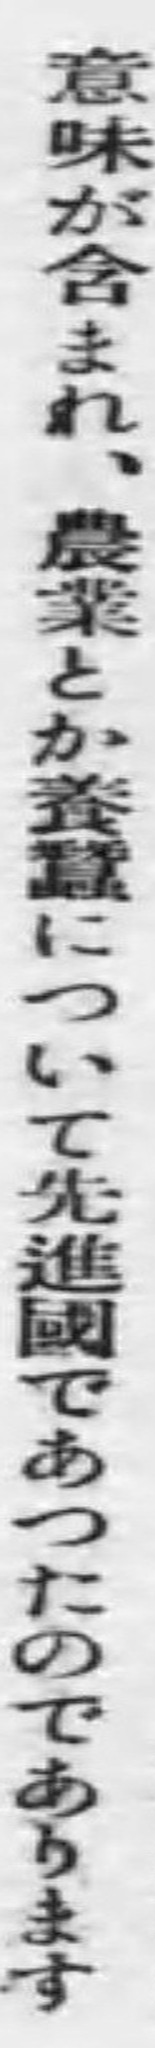意味が含まれ、農業とか養蚕について先進国であつたのであります
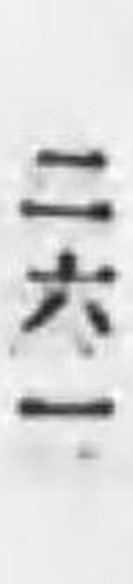二六一

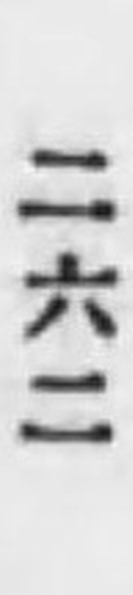二六二
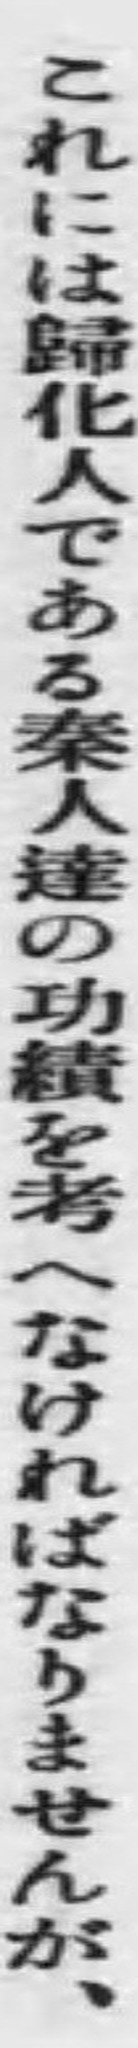これには帰化人である秦人達の功績を考へなければなりませんが、
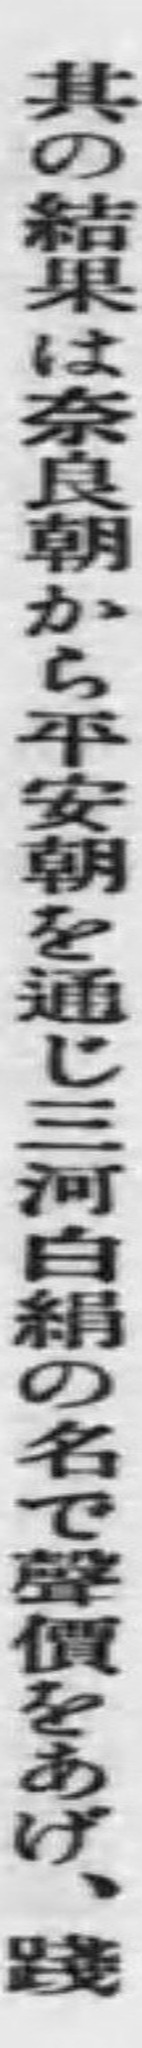其の結果は奈良朝から平安朝を通じ三河白絹の名で声価をあげ、践
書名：東三河道中記 : 豊橋市及其附近案内
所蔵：国立国会図書館 National Diet Library, JAPAN
